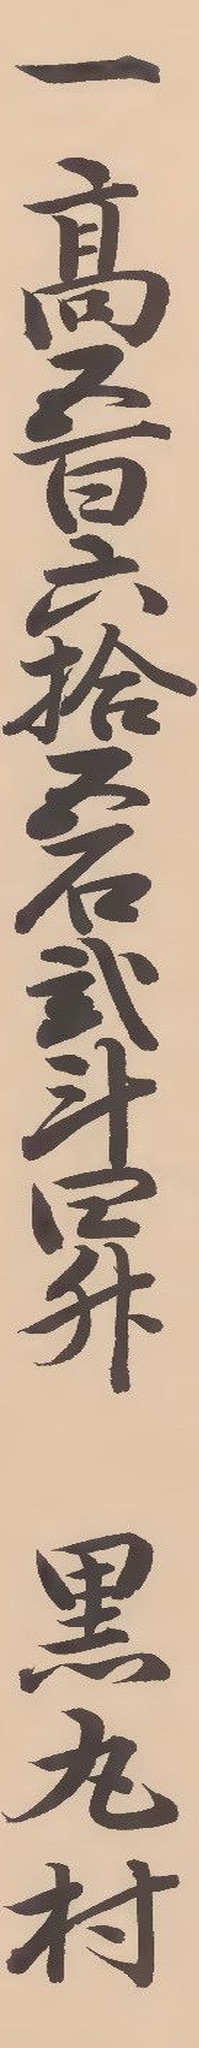一高五百六拾五石弐斗四升黒丸村
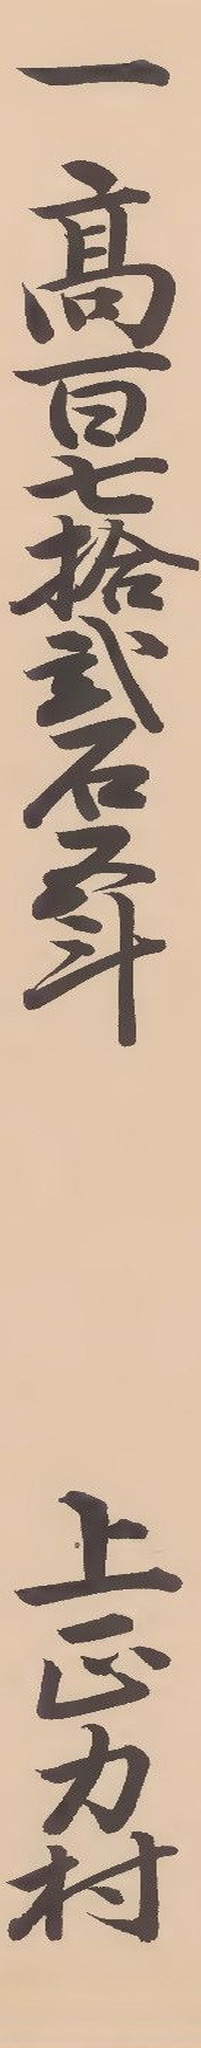一高百七拾弐石五斗上正力村
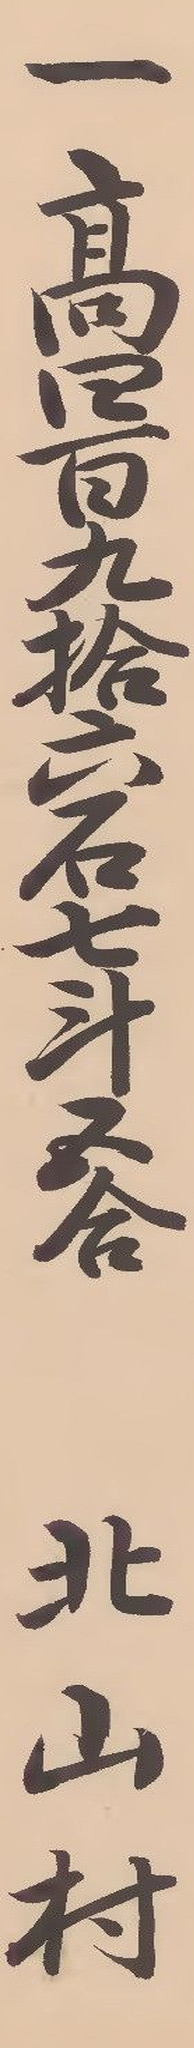一高四百九拾六石七斗五合北山村

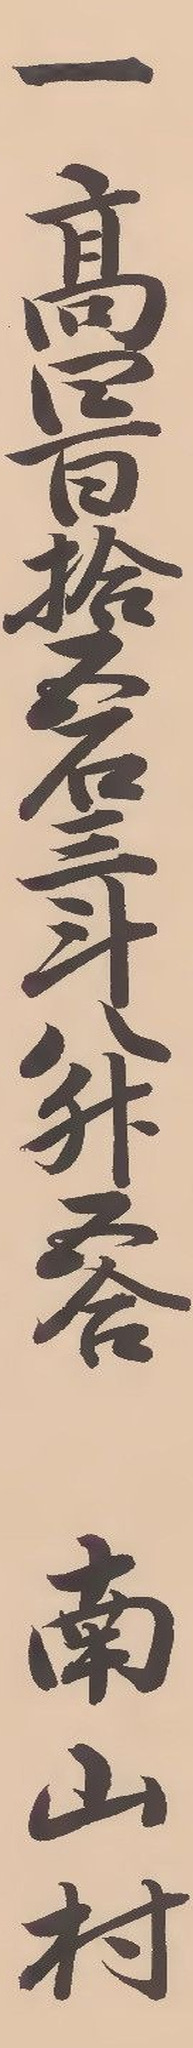一高四百拾五石三斗八升五合南山村
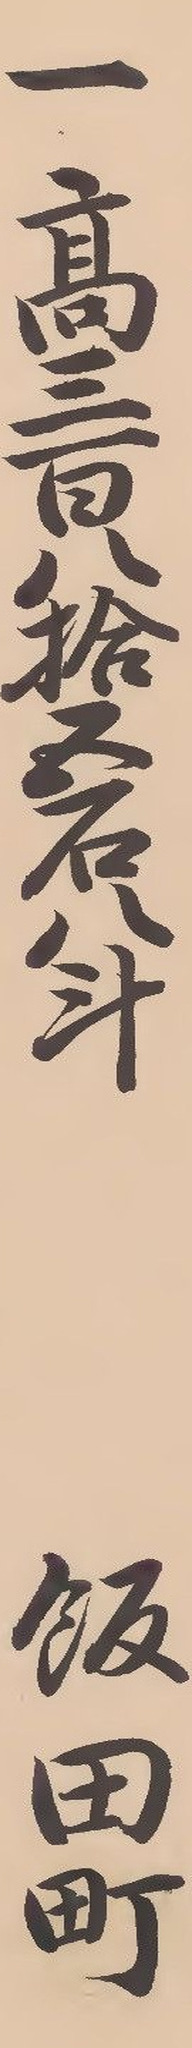一高三百八拾五石八斗飯田町
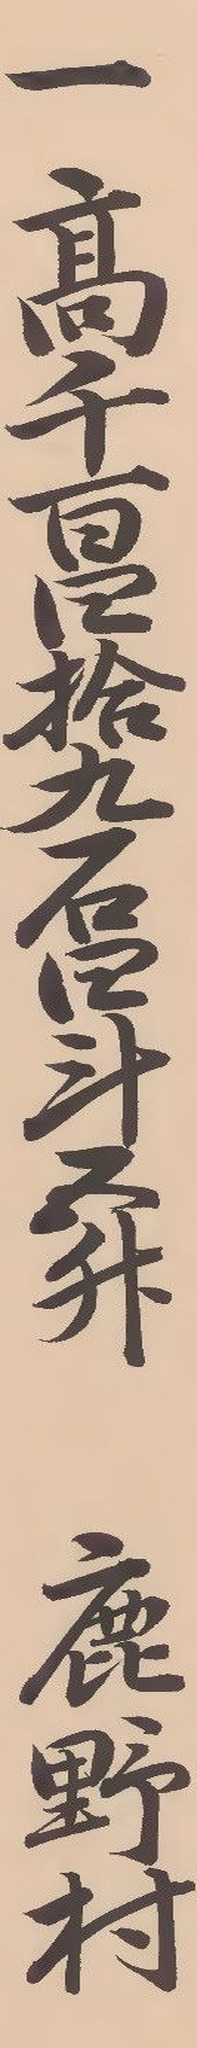一高千百四拾九石四斗五升鹿野村
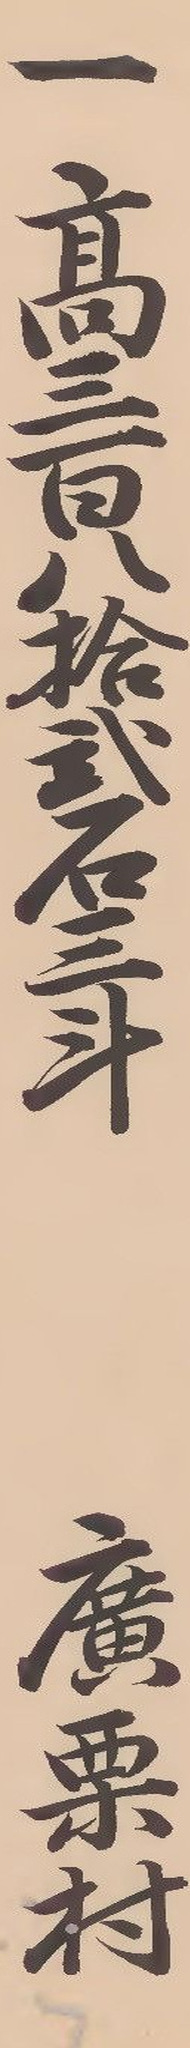一高三百八拾弐石三斗広栗村
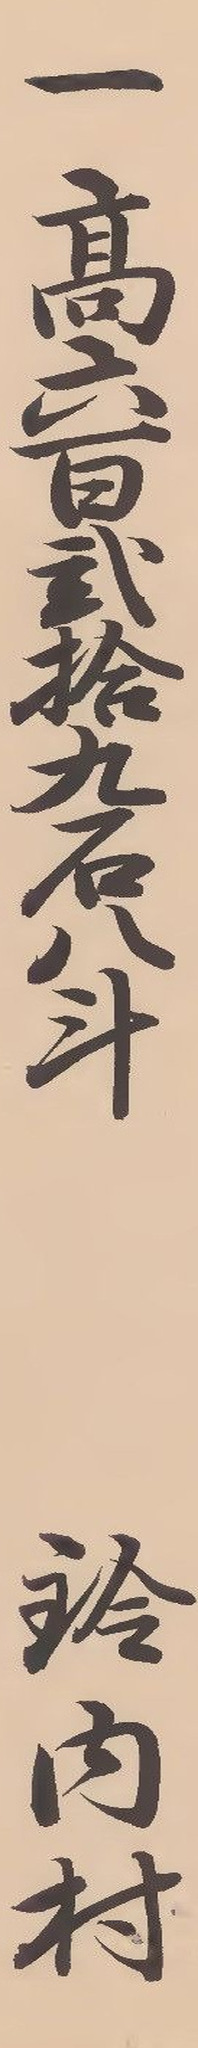一高六百弐拾九石八斗鈴内村
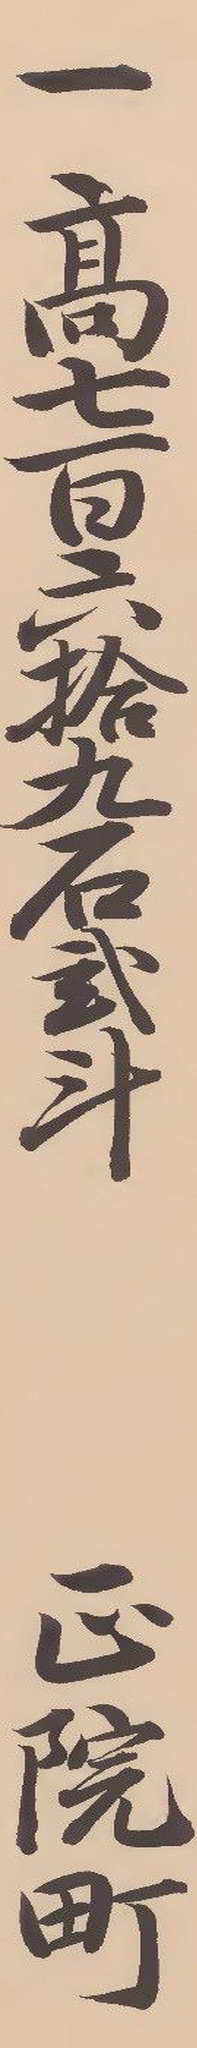一高七百六拾九石弐斗正院町
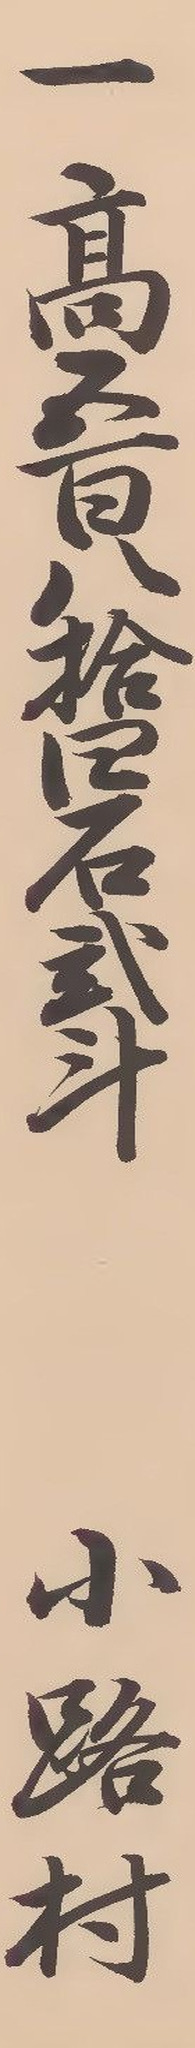一高五百八拾四石弐斗小路村

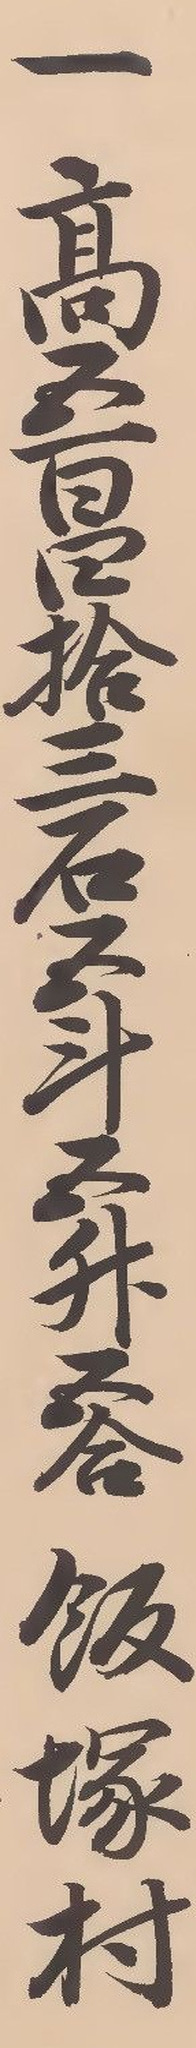一高五百四拾三石五斗五升五合飯塚村
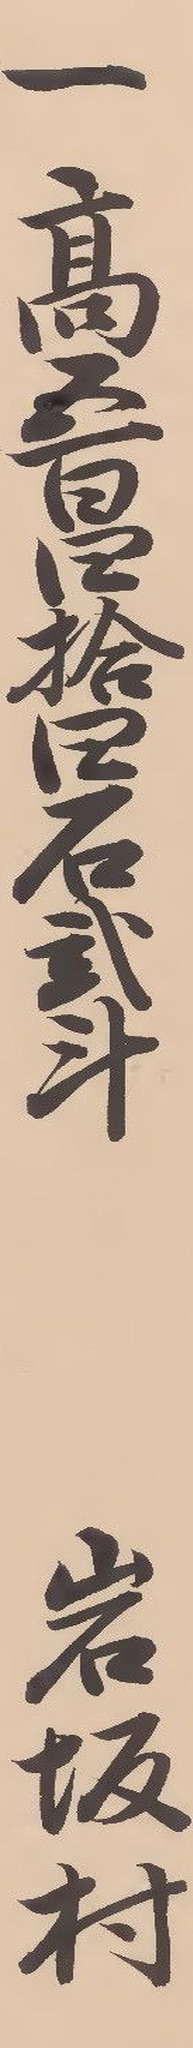一高五百四拾四石弐斗岩坂村
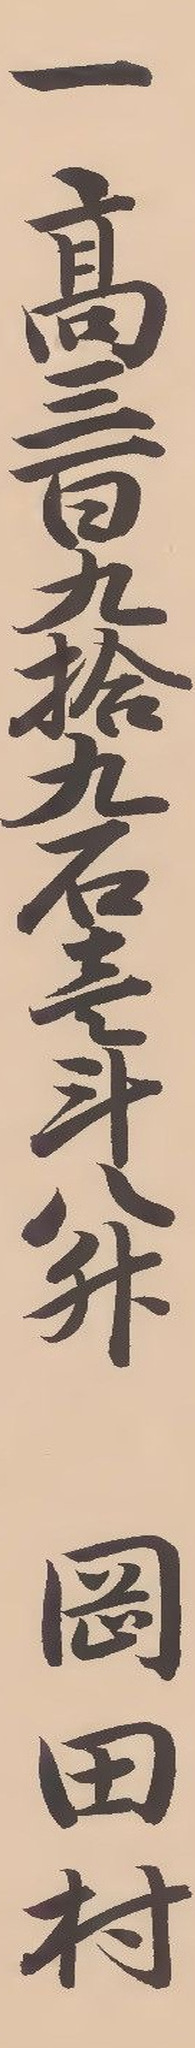一高三百九拾九石壱斗八升岡田村
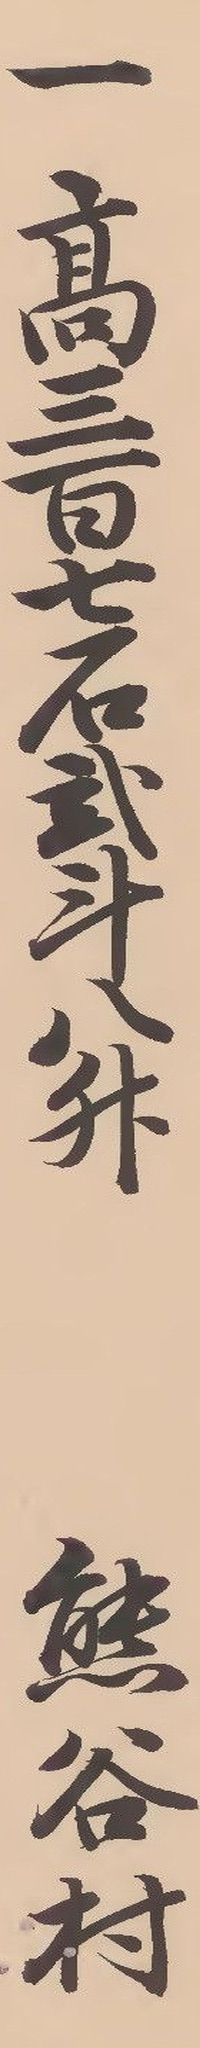一高三百七石弐斗八升熊谷村
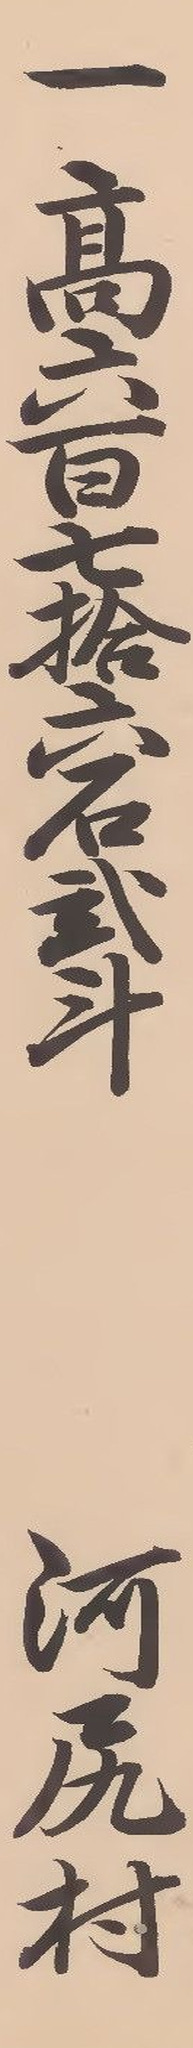一高六百七拾六石弐斗河尻村
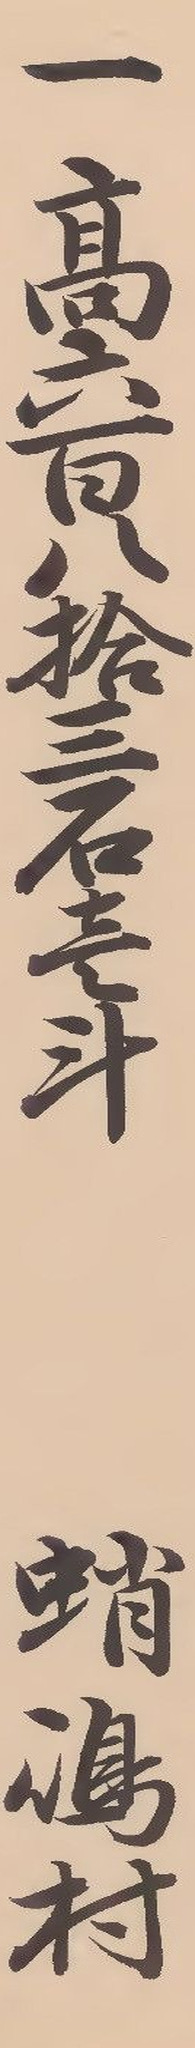一高六百八拾三石壱斗蛸島村
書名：能登国郷帳
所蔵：国立公文書館 National Archives of Japan
